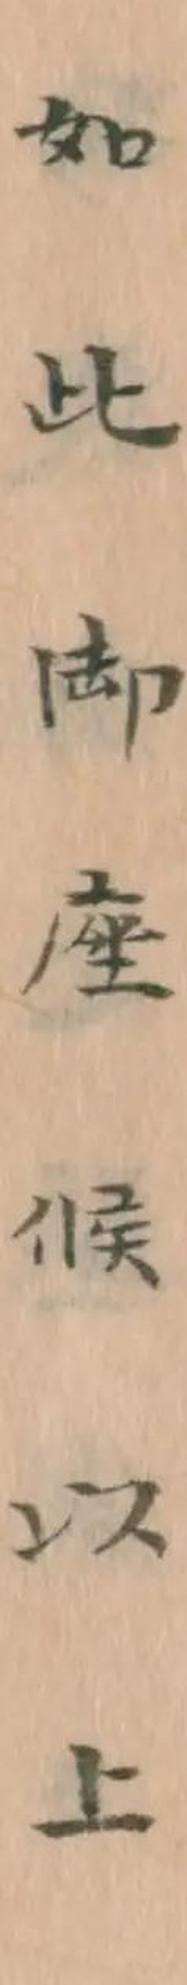如此御座候以上
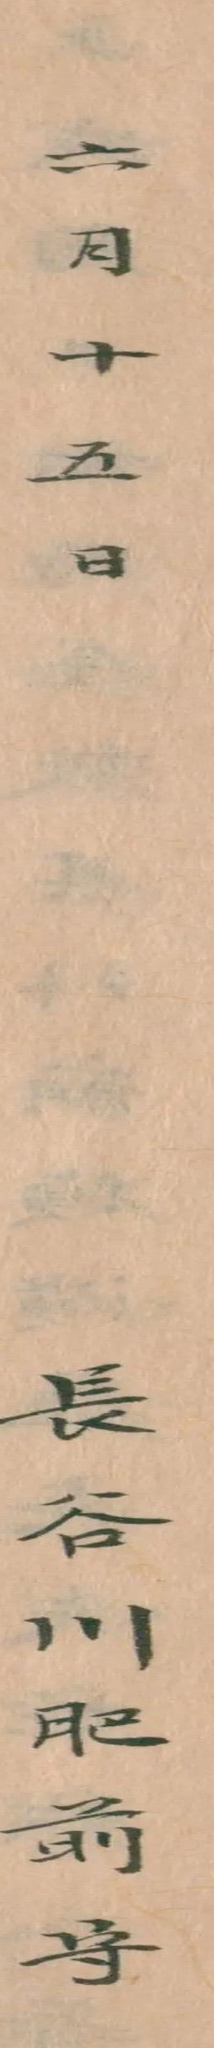六月十五日長谷川肥前守
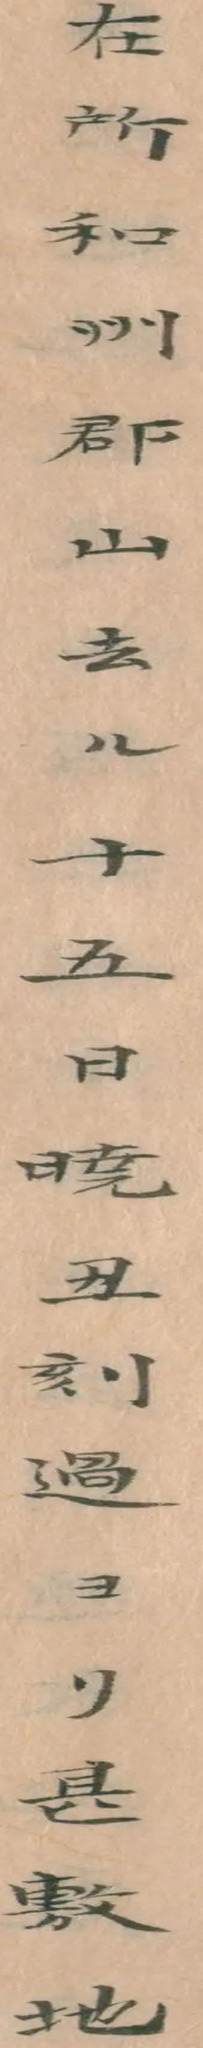在所和州郡山去ㇽ十五日暁丑刻過ヨリ甚敷地
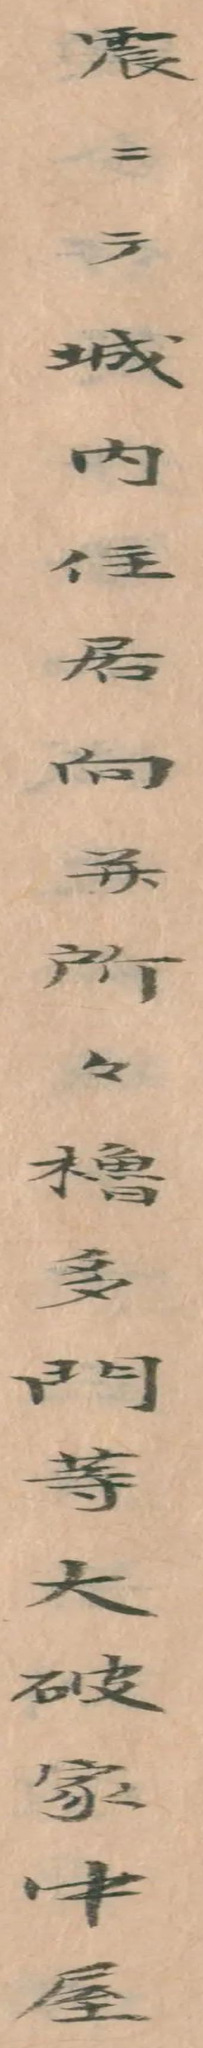震ニテ城内住居向并所々櫓多門等大破家中屋
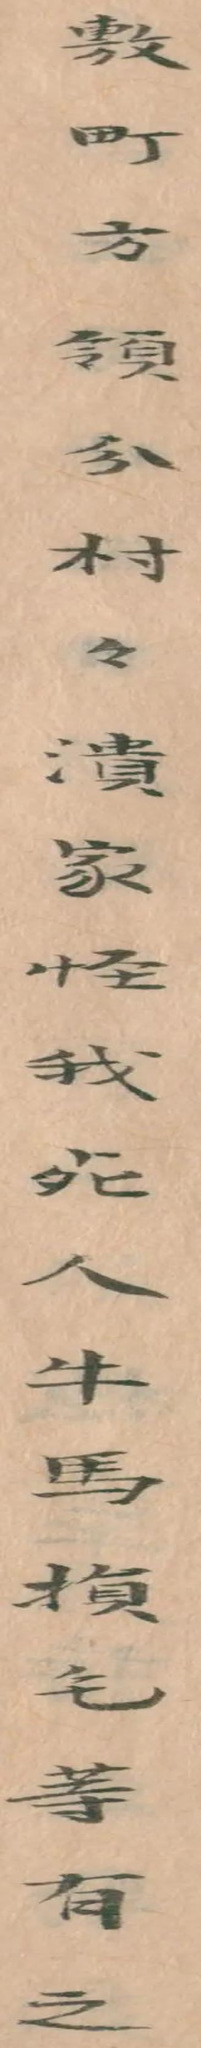敷町方領分村々潰家怪我死人牛馬損毛等有之
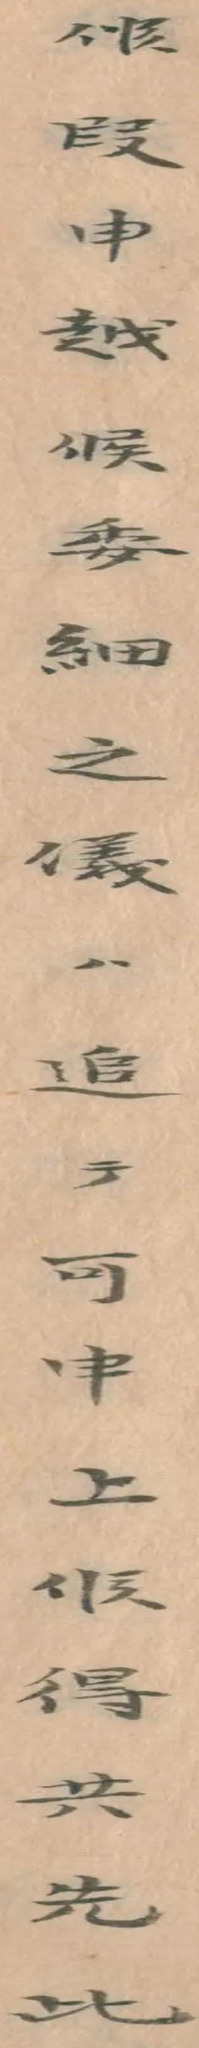候假申越候委細之儀ハ追テ可申上候得共先此

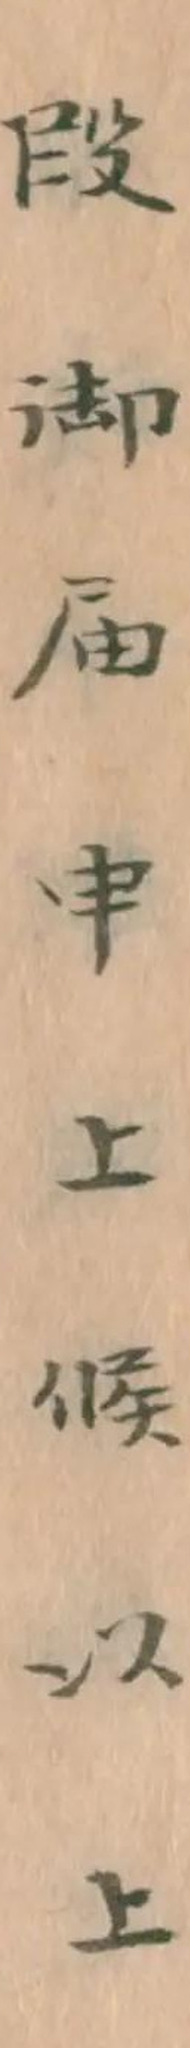段御届申上候以上
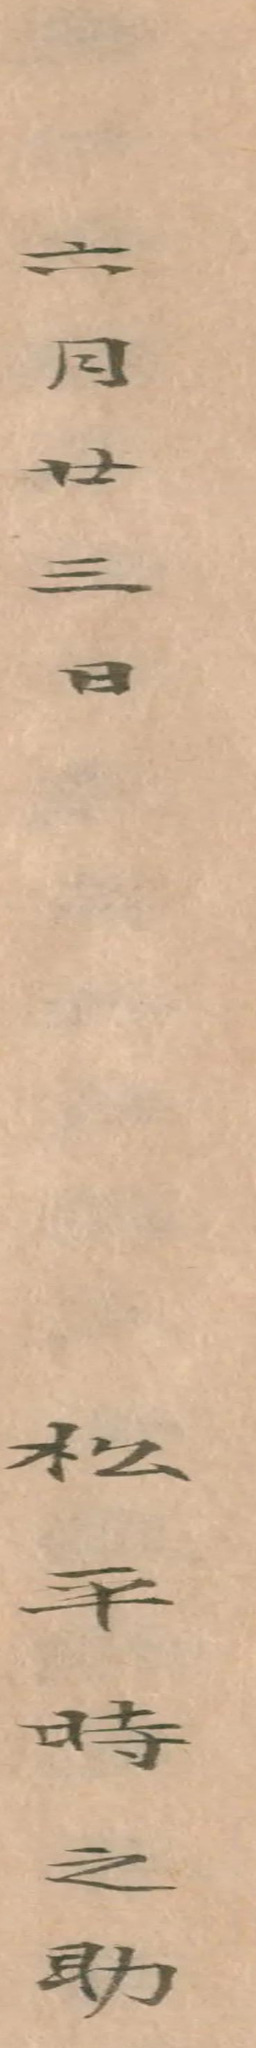六月廿三日松平時之助
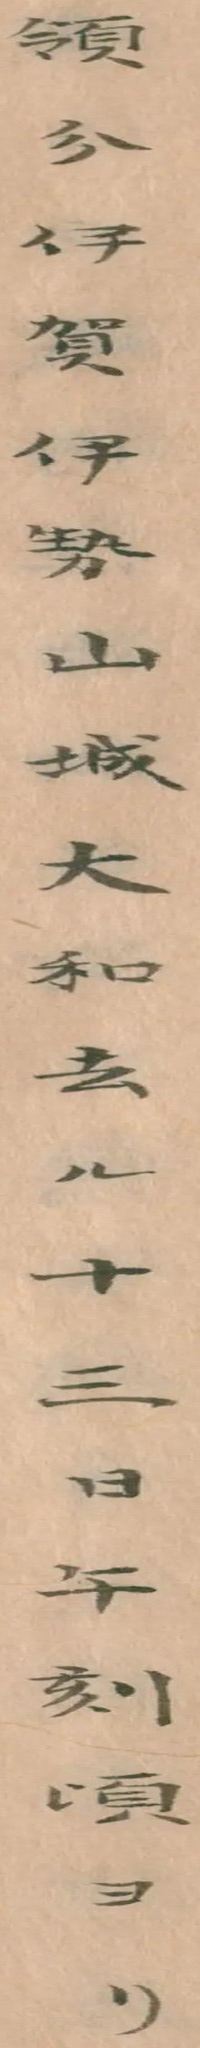領分伊賀伊勢山城大和去ル十三日午刻頃ヨリ
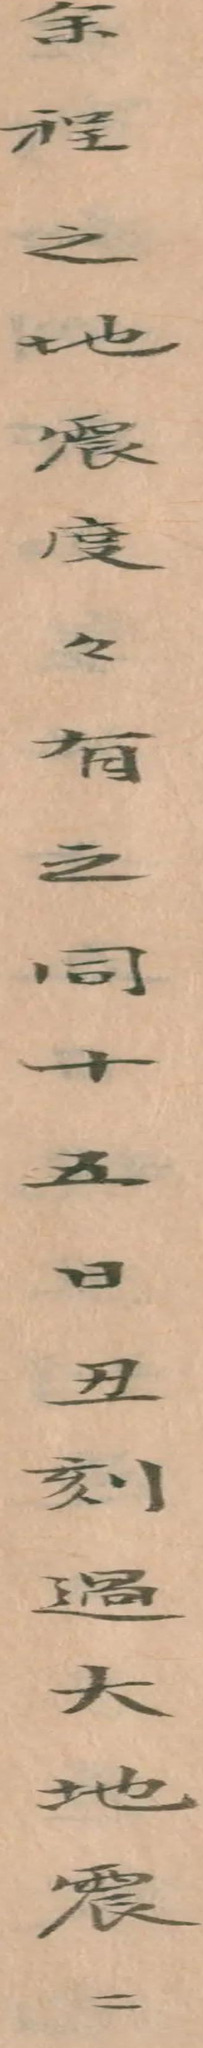余程之地震度々有之同十五日丑刻過大地震ニ
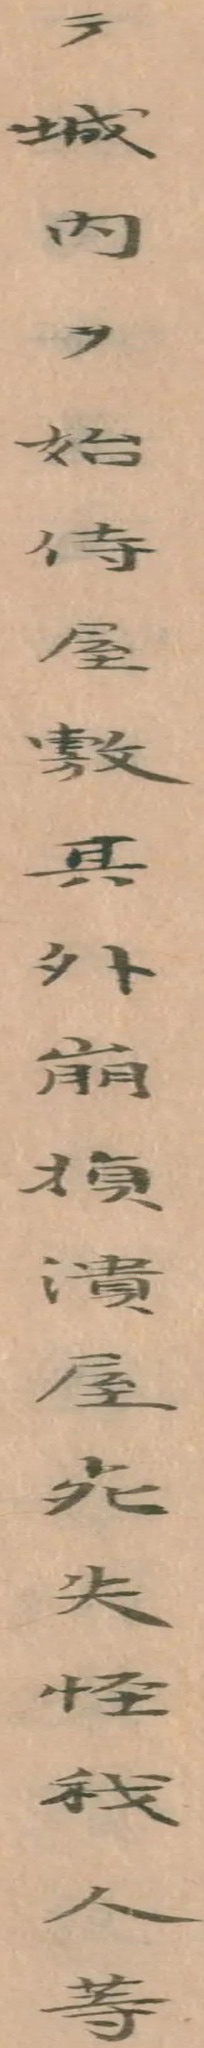テ城内ヲ始侍屋敷其外崩損潰屋死失怪我人等
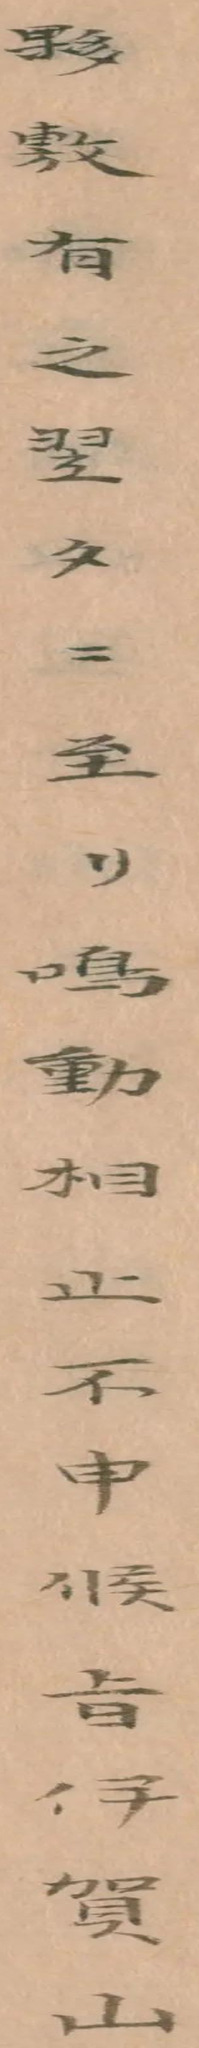夥敷有之翌夕二至リ鳴動相止不申候旨伊賀山
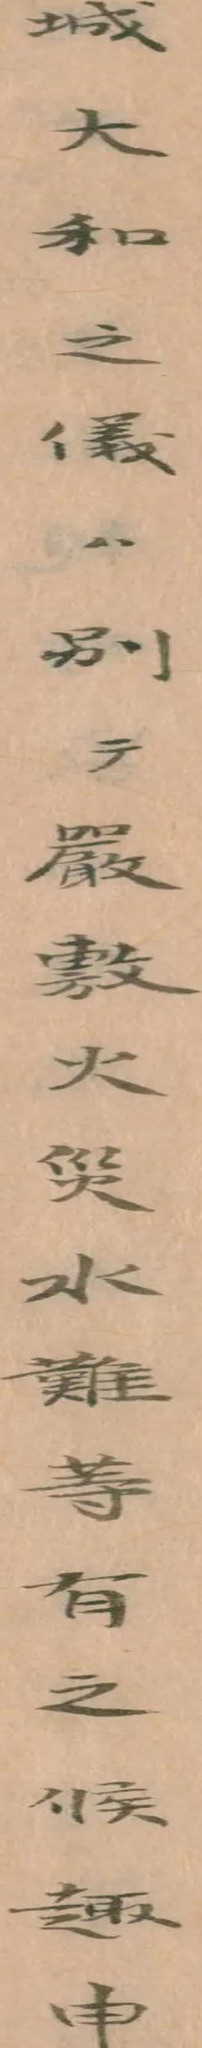城大和之儀ハ別テ厳敷大災水難等有之候趣申
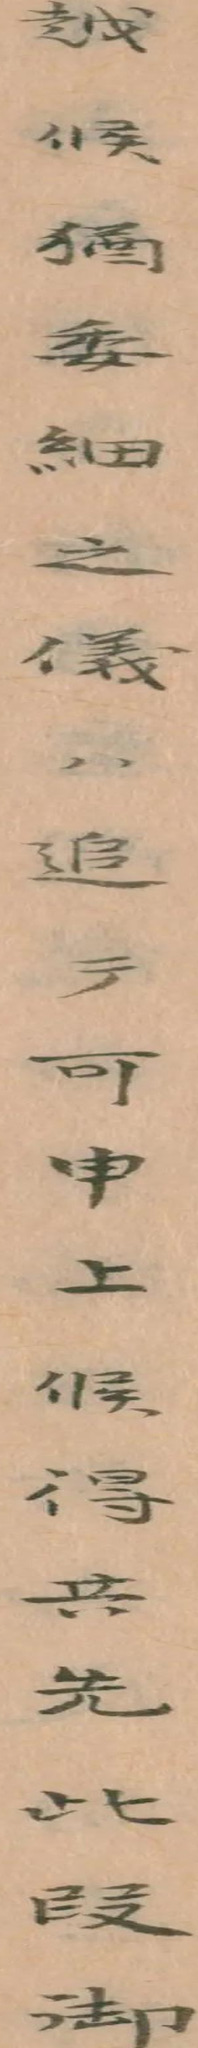越候猶委細の儀ハ追テ可申上候得共先此段御
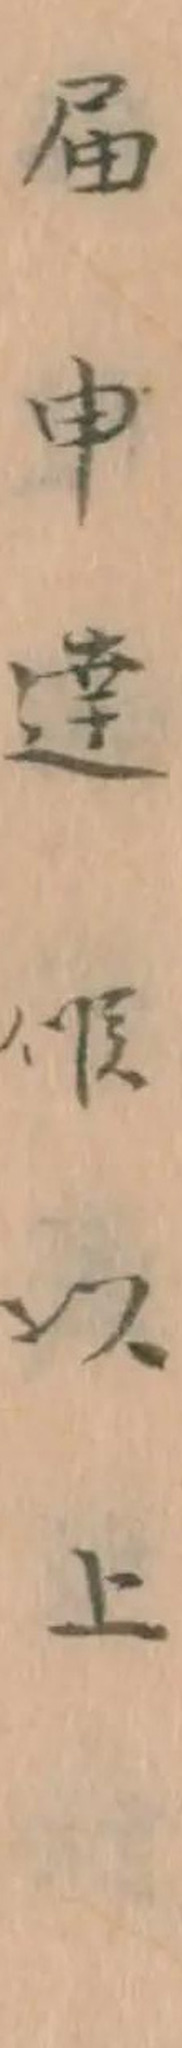届申達候以上
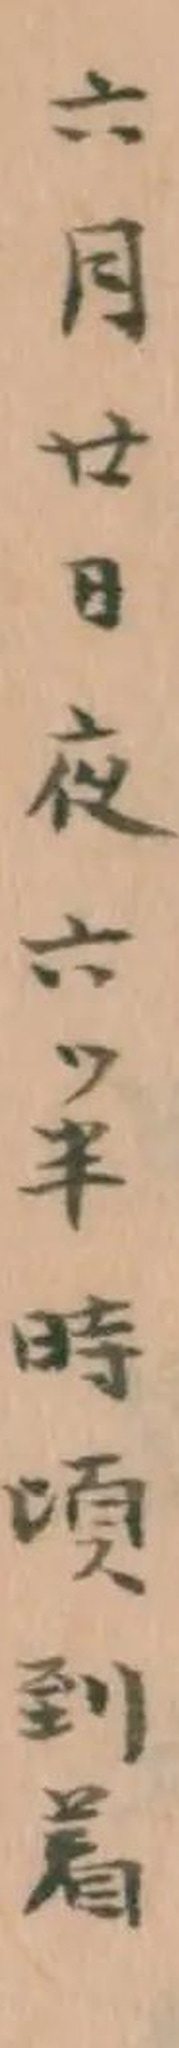六月廿日夜六ッ半時頃到着
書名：地災撮要. 巻1(噴火山・地震ノ部)
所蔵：国立国会図書館 National Diet Library, JAPAN
